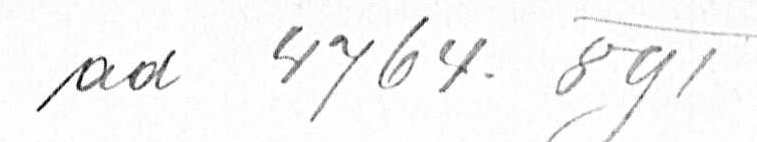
ad 4764 – 1891
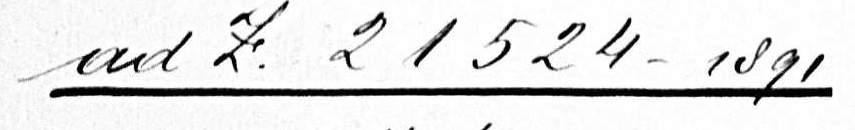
ad Z. 21524 - 1891/
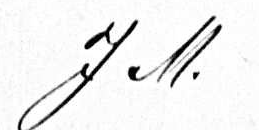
JM
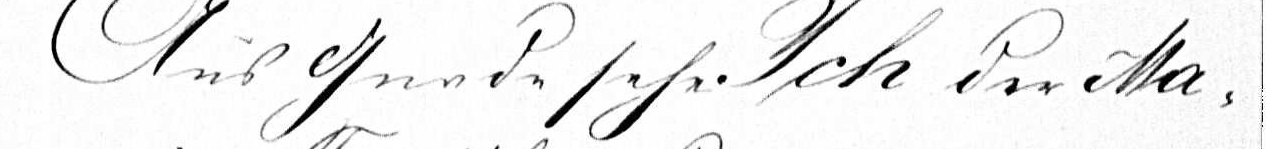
Aus Gnade sehe Ich der Ma¬
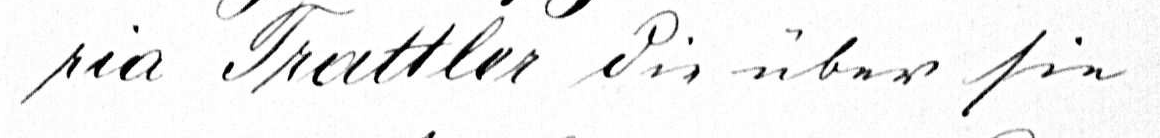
ria Trattler die über sie
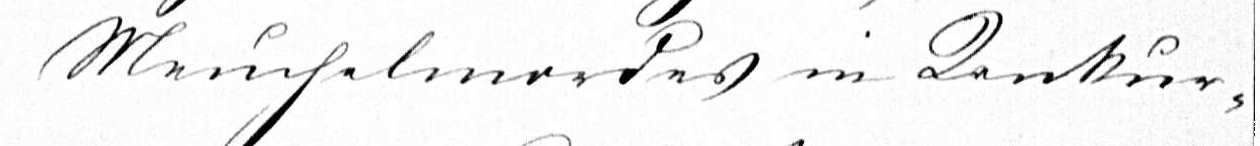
Meuchelmordes in Concur¬
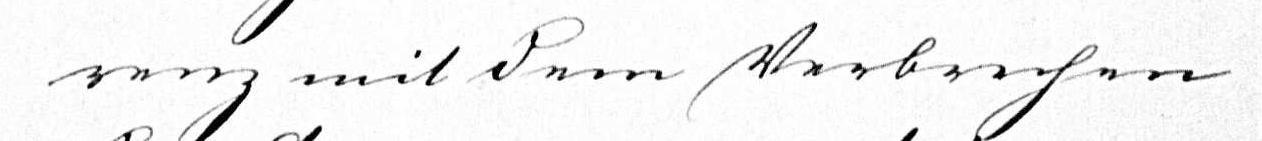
renz mit dem Verbrechen
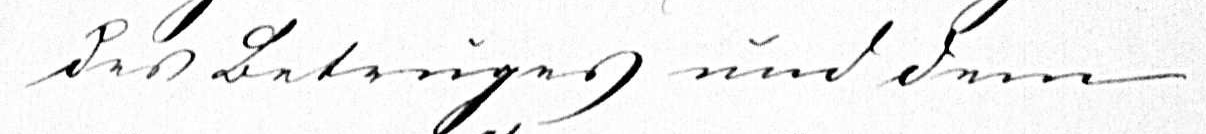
des Betruges, und dem
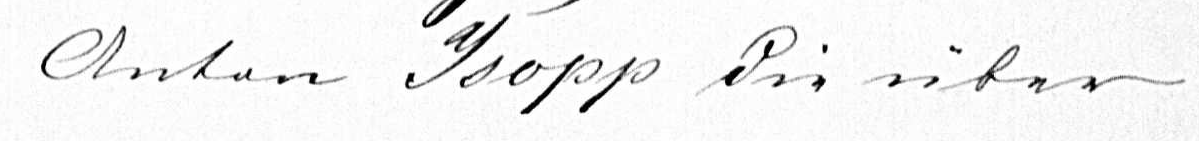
Anton Isopp die über
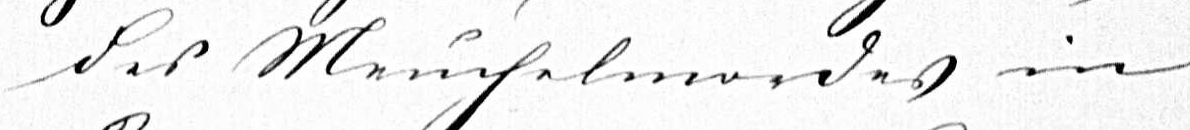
des Meuchelmordes in
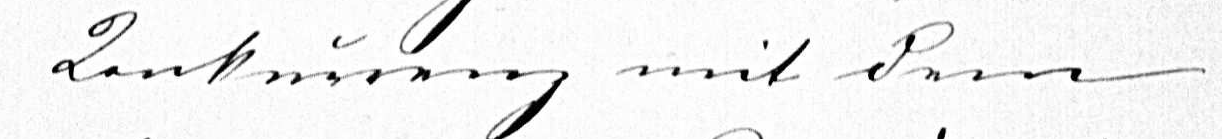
Concurrenz mit dem
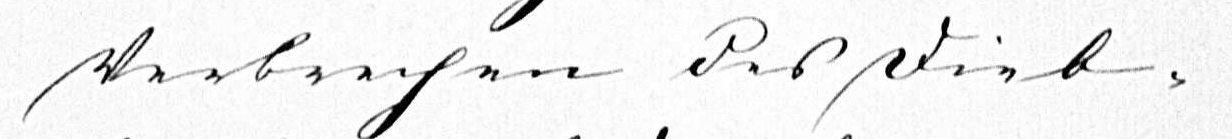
Verbrechen des Dieb¬
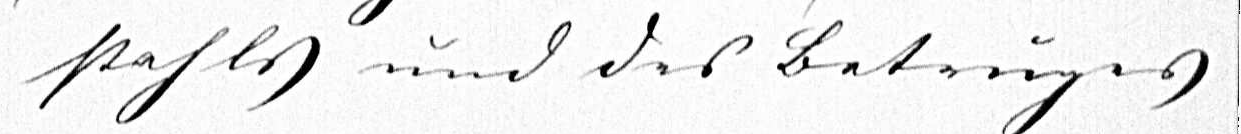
stahles und des Betruges
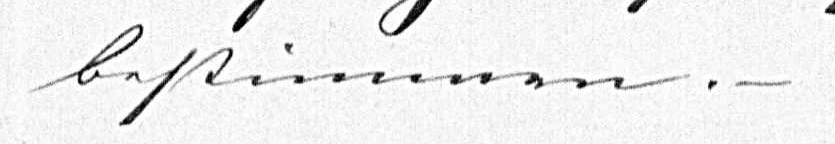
bestimmen.
